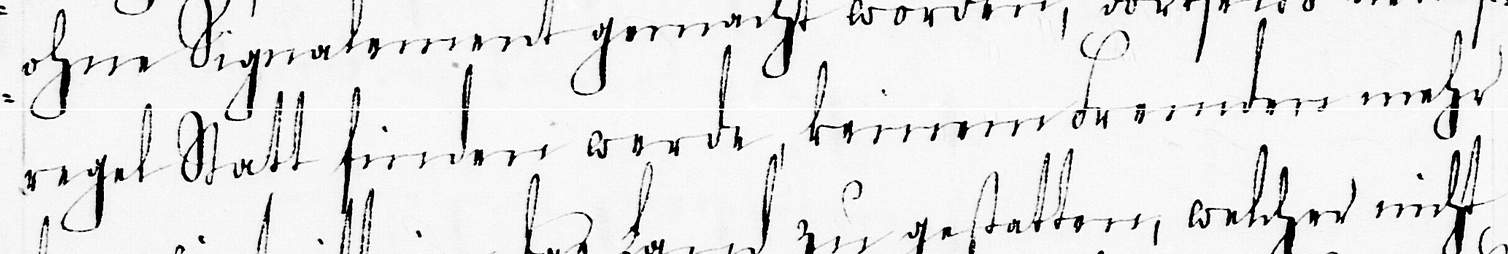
regel Statt finden werde, keinem Fremden mehr
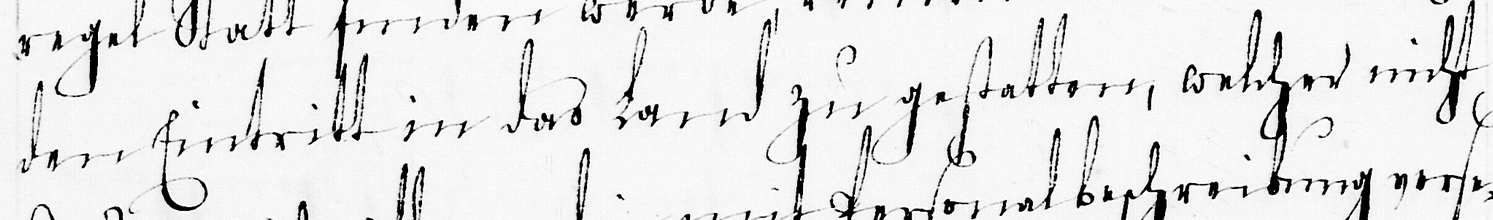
den Eintritt in das Land zu gestatten, welcher nicht
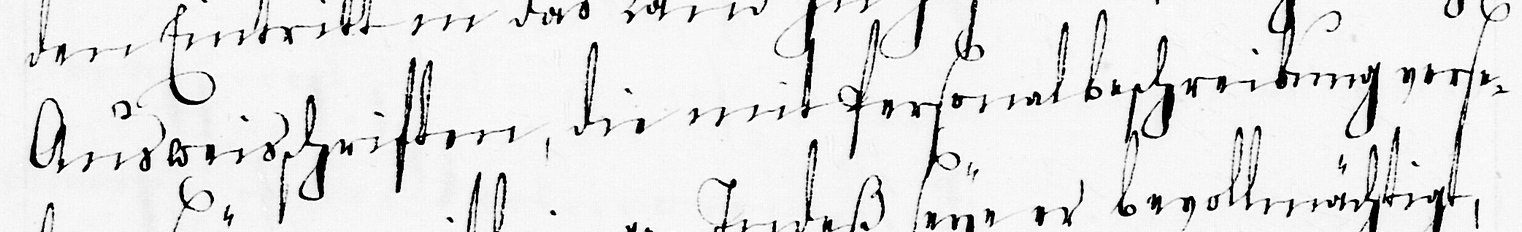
Ausweisschriften, die mit Personalbeschreibung verse¬
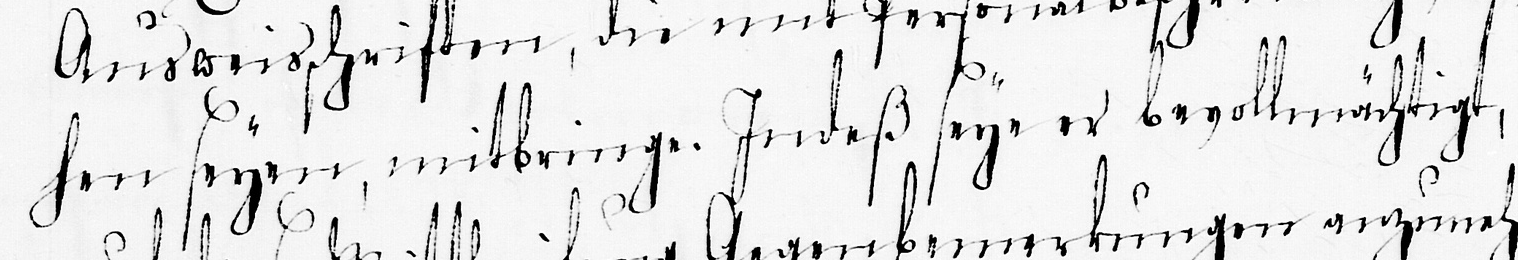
hen seyen, mitbringe. Indeß seye er bevollmächtig¬
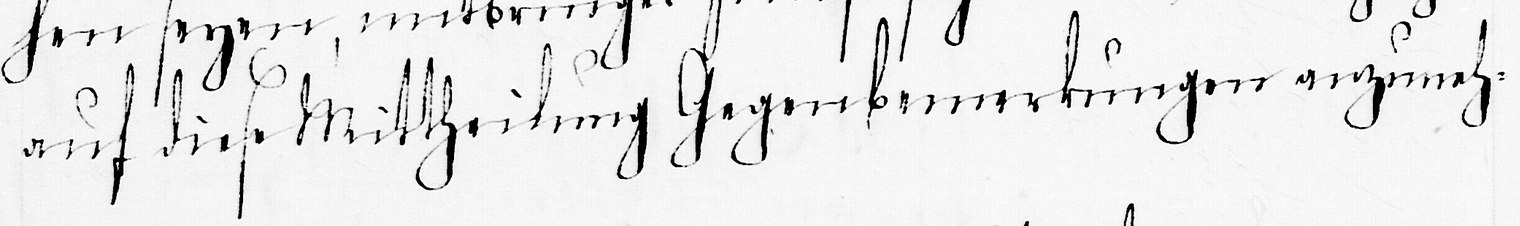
auf diese Mittheilung Gegenbemerkungen anzuneh¬
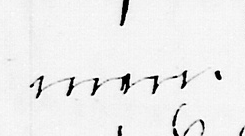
men.
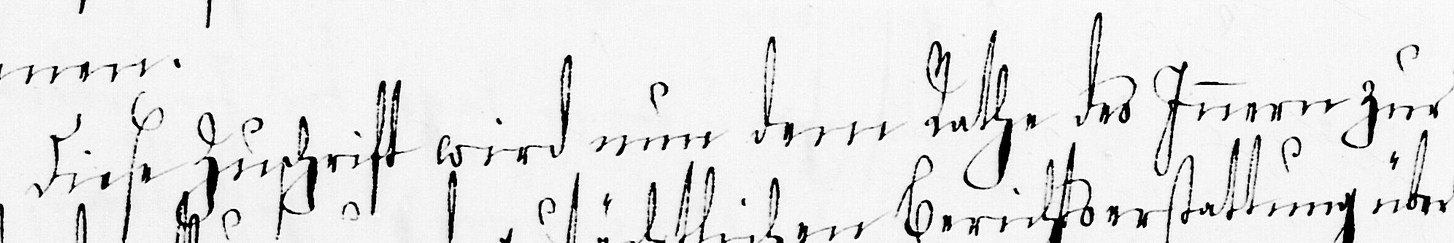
Diese Zuschrift wird nun dem Rathe des Innern zur
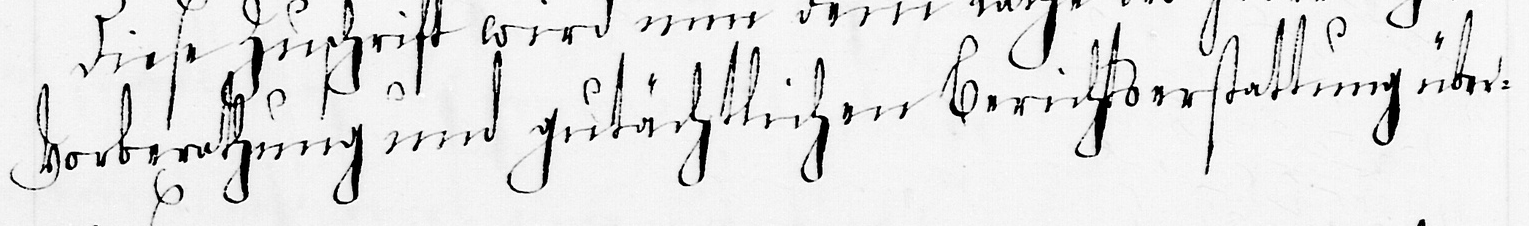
Vorberathung und gutächtlichen Berichtserstattung über¬
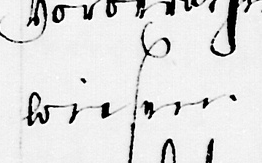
wiesen.
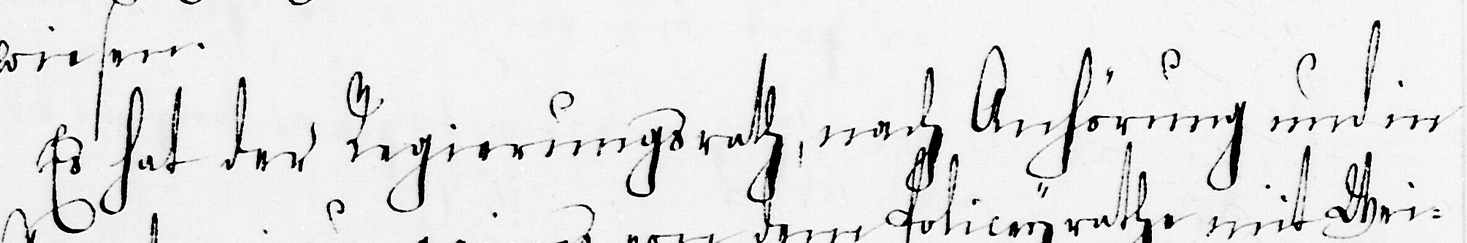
Es hat der Regierungsrath, nach Anhörung und in
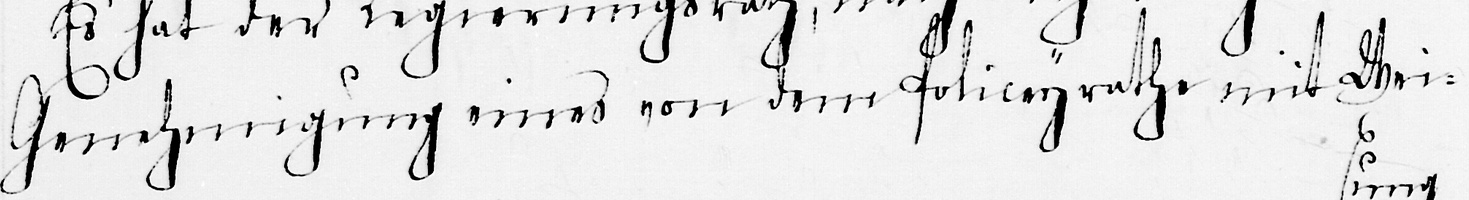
Genehmigung eines von dem Policeyrathe mit Wei-
